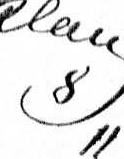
8
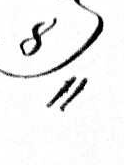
11
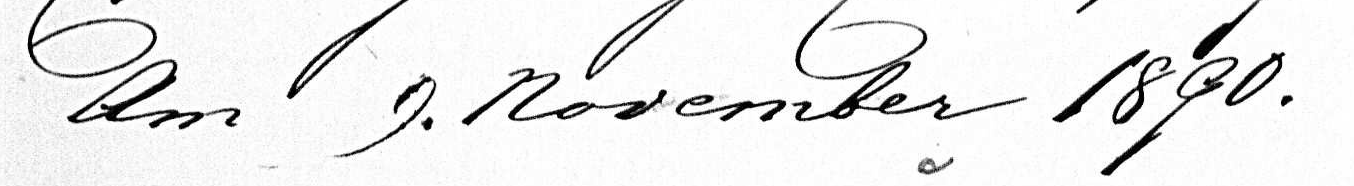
Am 9. November 1890.
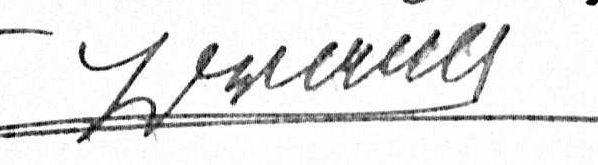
Braun
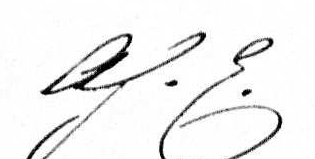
Ah. E.
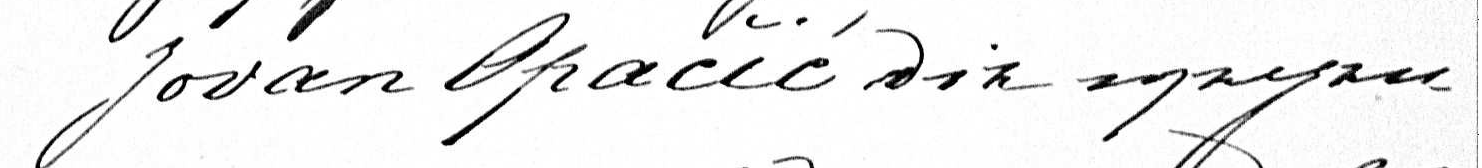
Jovan Opačić die wegen
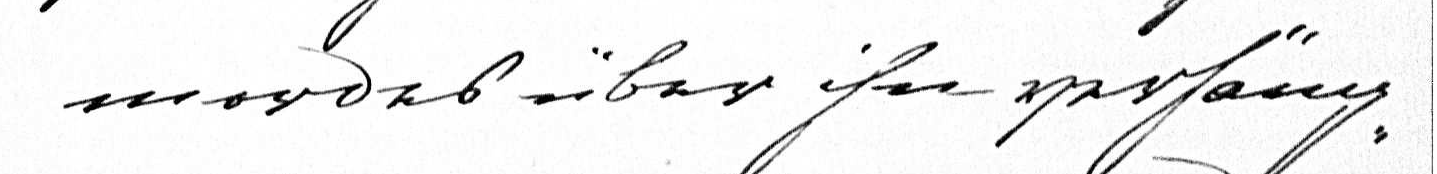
mordes über ihn verhäng¬
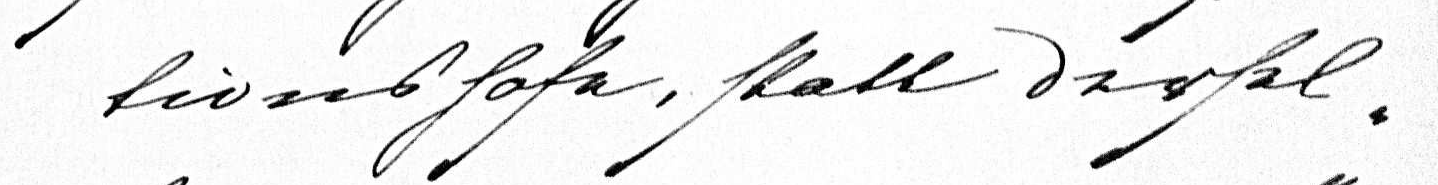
tionshofe, statt dersel¬
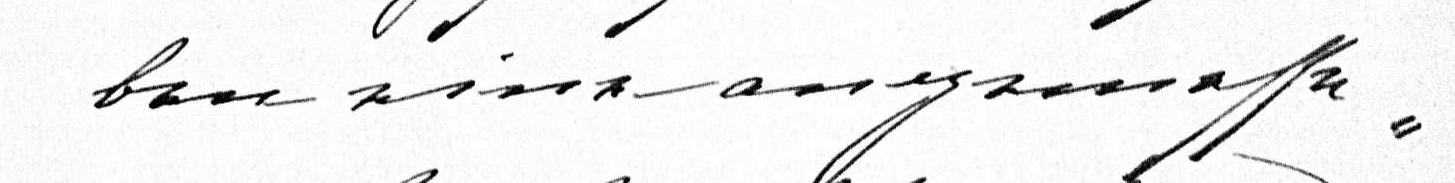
ben eine angemesse¬
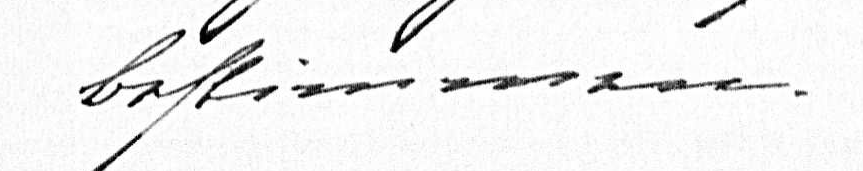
bestimmen.
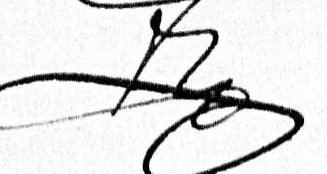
xx
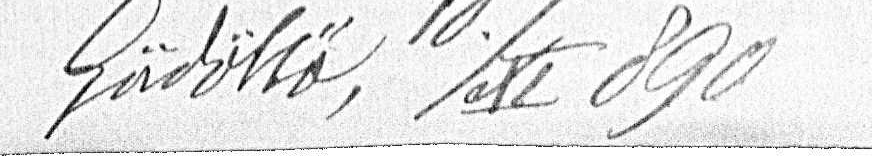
Gädöltö, 10./XI 890
